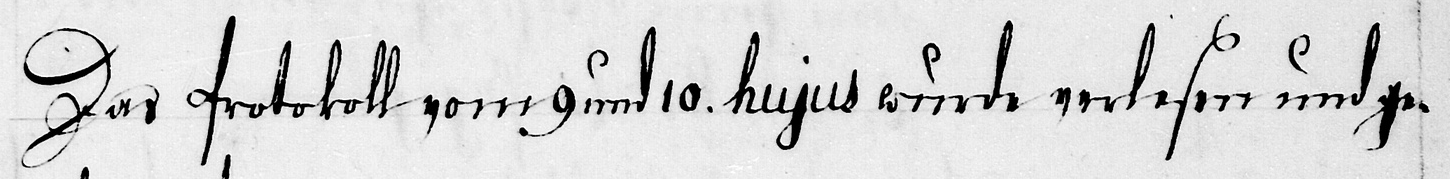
Das Protokoll vom 9 und 10. hujus wurde verlesen und ge¬
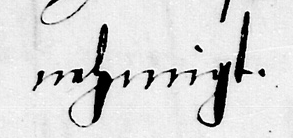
nehmigt.
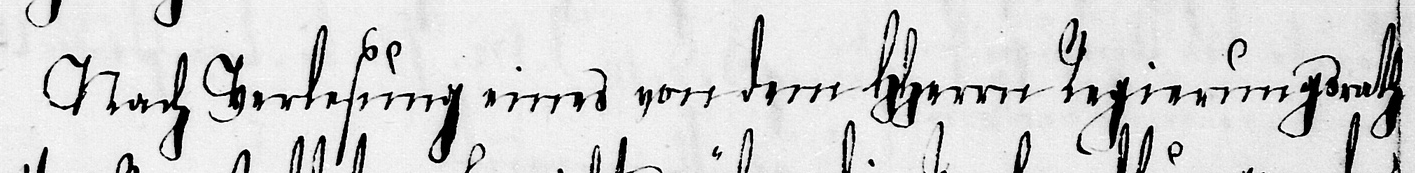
Nach Verlesung eines von dem HHerrn Regierungsrath
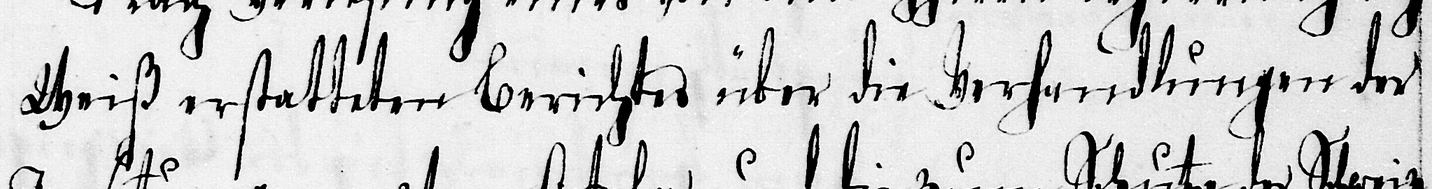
Weiß erstatteten Berichtes über die Verhandlungen der
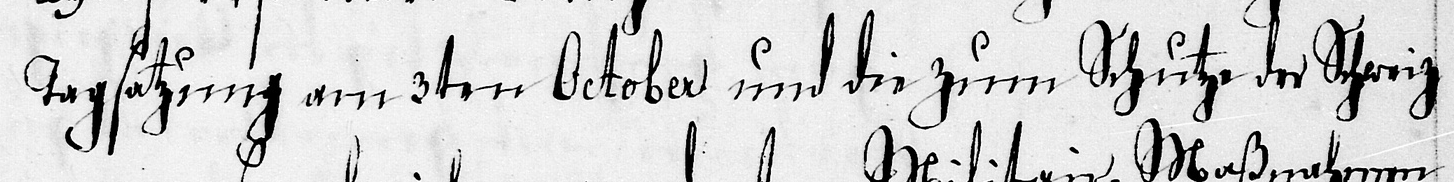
Tagsatzung am 3ten October und die zum Schutze der Schweiz
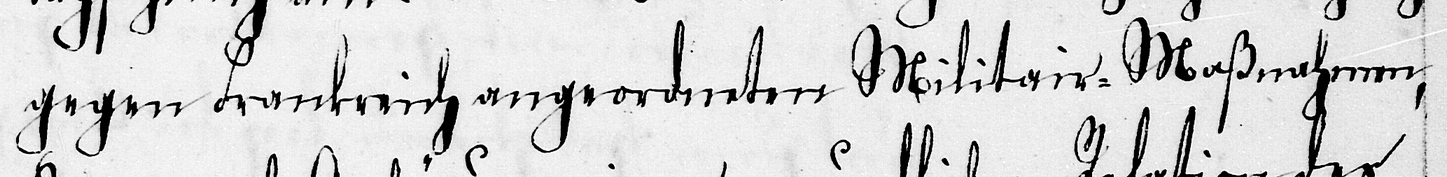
gegen Frankreich angeordneten Militair-Maßnahmen,
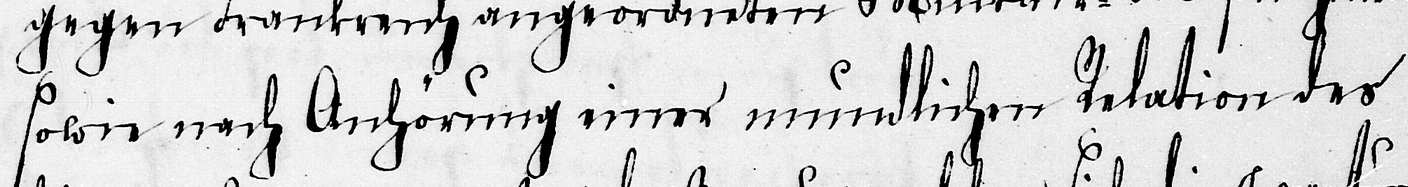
sowie nach Anhörung einer mundlichen Relation des
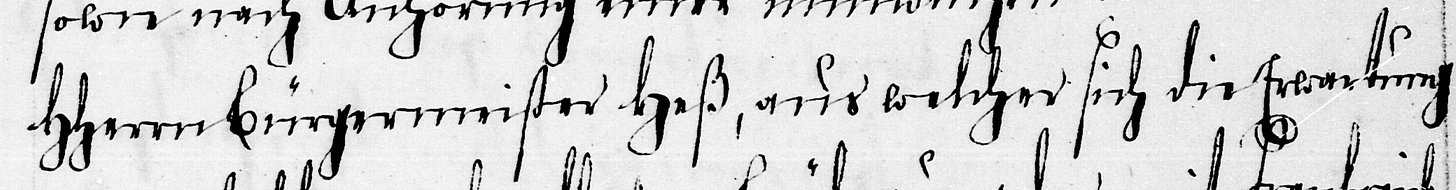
HHerrn Bürgermeister Heß, aus welcher sich die Erwartung
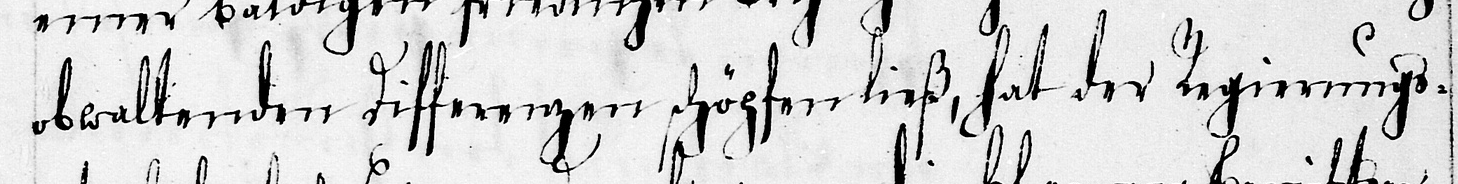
obwaltenden Differenzen schöpfen ließ, hat der Regierungs¬
